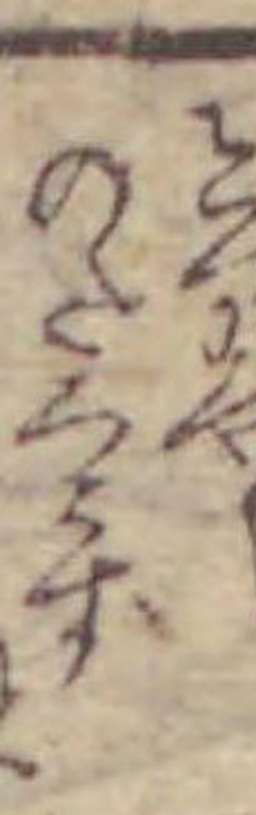のたくらずと
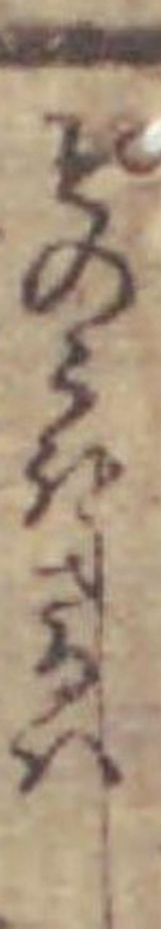そのときさるは
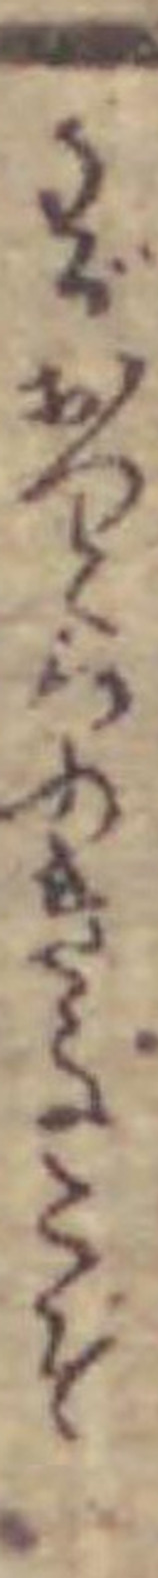わがおつとかにきよこそ
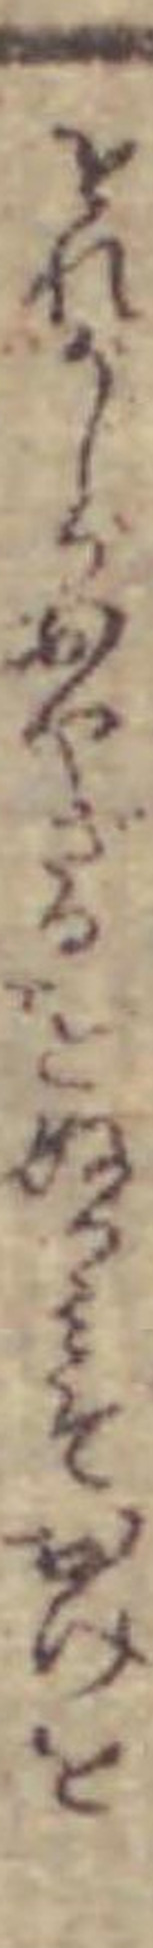それがしがおやざるをぬかみそおけを
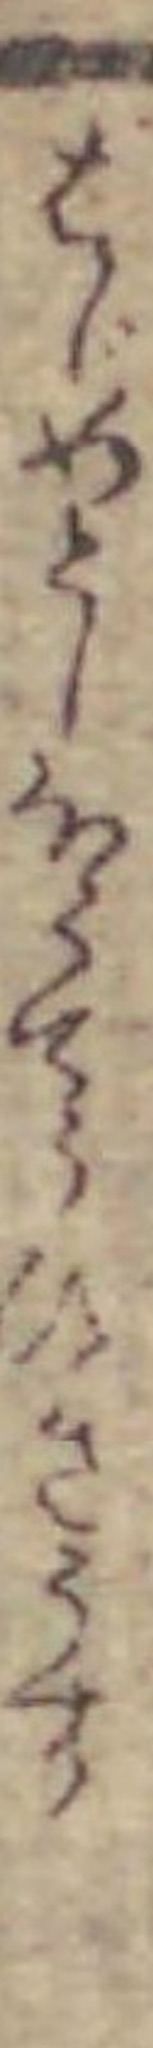はじめとしほうてうひきうす
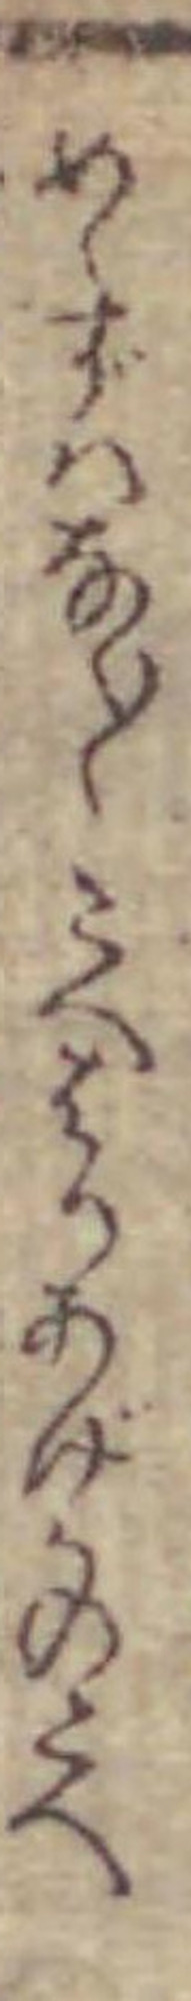めゝすはなく〱こへはりあげかのこへむごふ
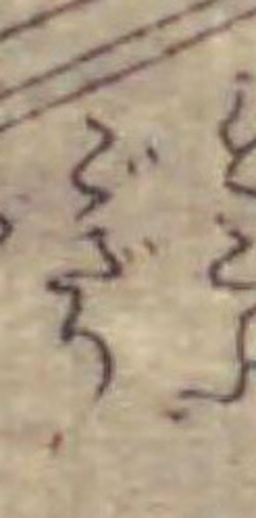ござり
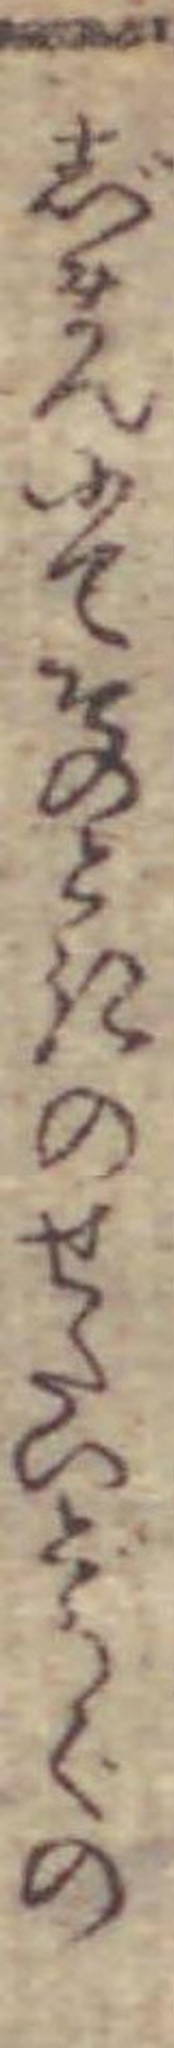じまんにてそのときのせたいどうぐのござり
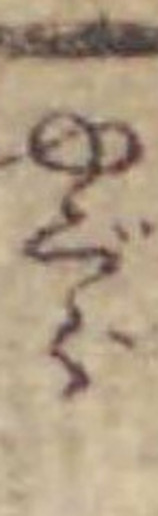やぐら
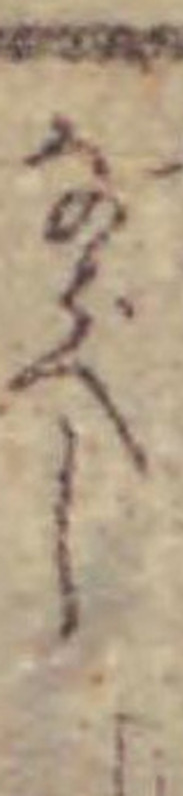ならべし
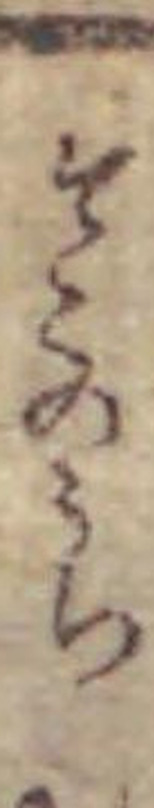そこのうち
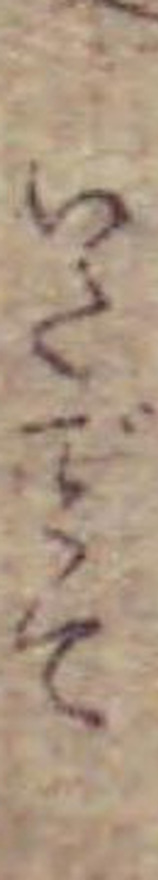いたでゝて
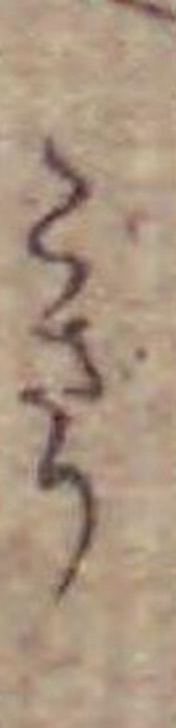ござり

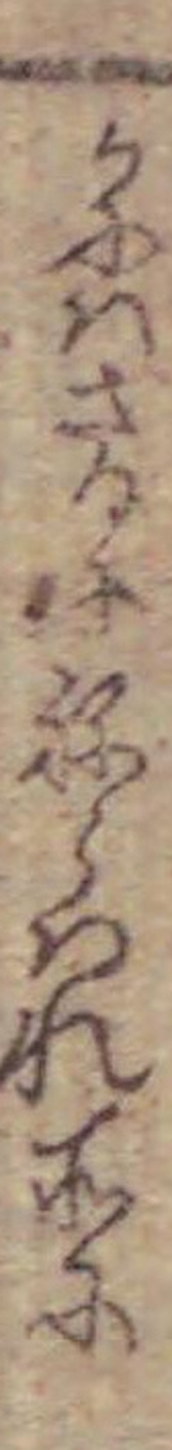かにはさるにねらはれ所に
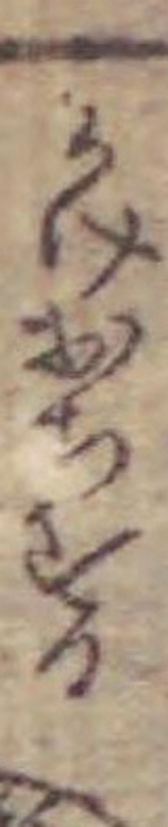かけおちする
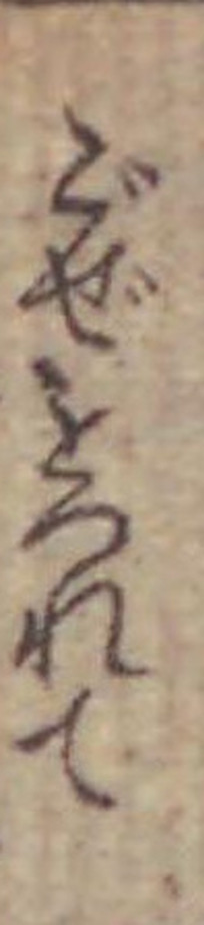ごぜをつれて
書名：交古勢昔咄 : 2巻
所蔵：国立国会図書館 National Diet Library, JAPAN
